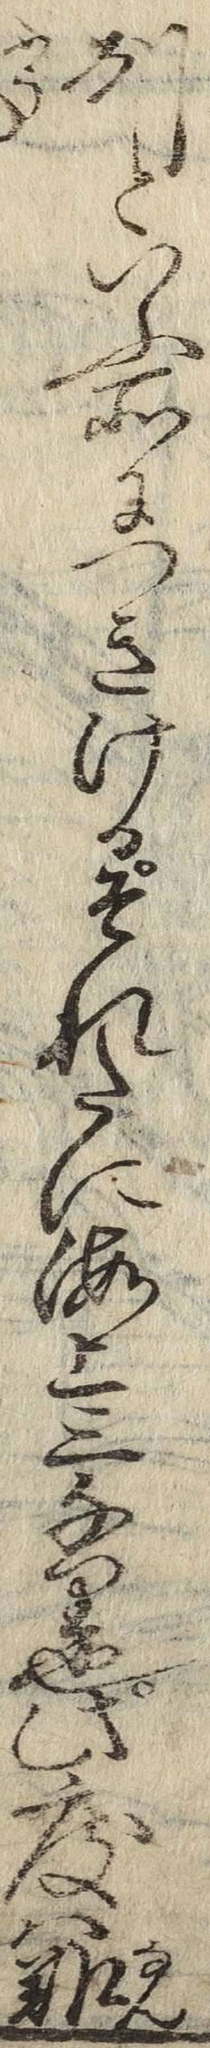州といふ所につきける。それたに海上三千里也。此度は難
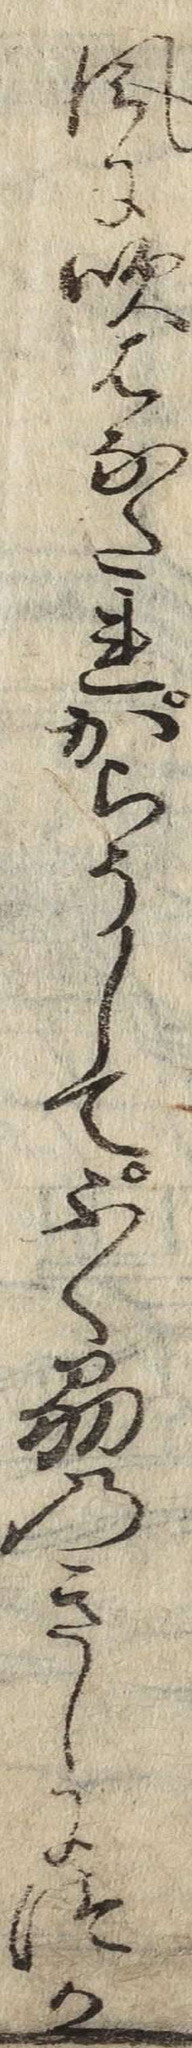風に吹はなたれ。からうして。ふく州のきしにつか
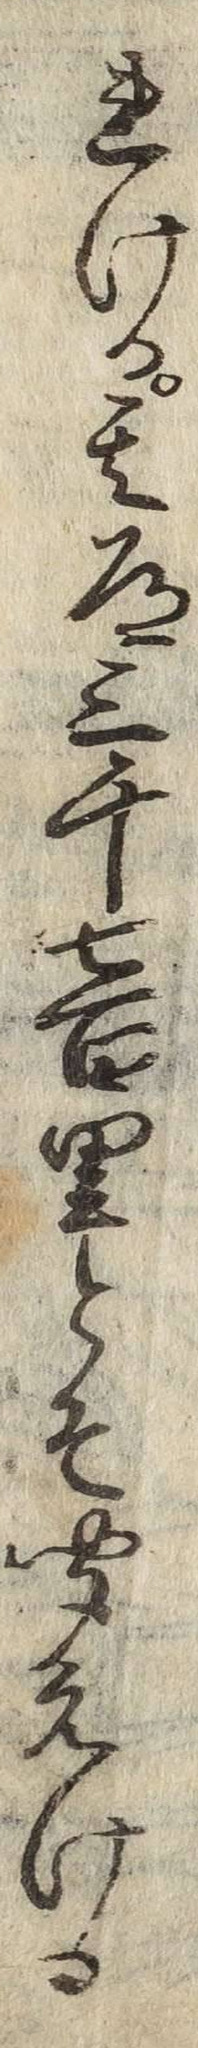れける。其道三千七百里とそ聞えける

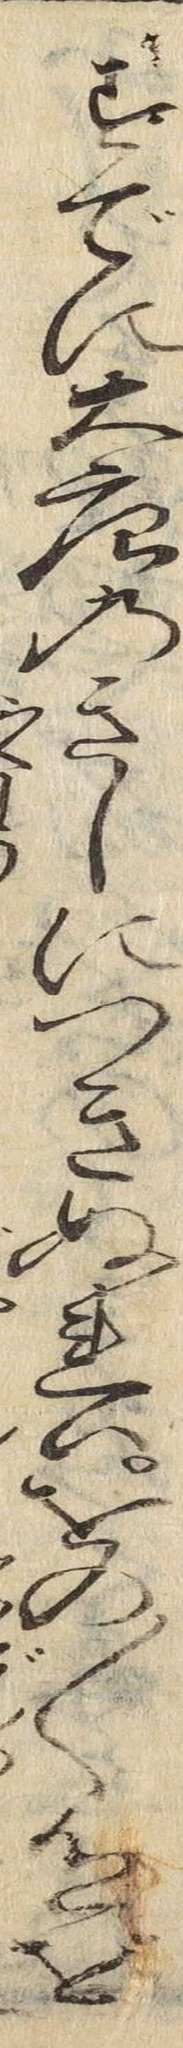すでに大唐のきしにつきぬれば。をの〳〵色を
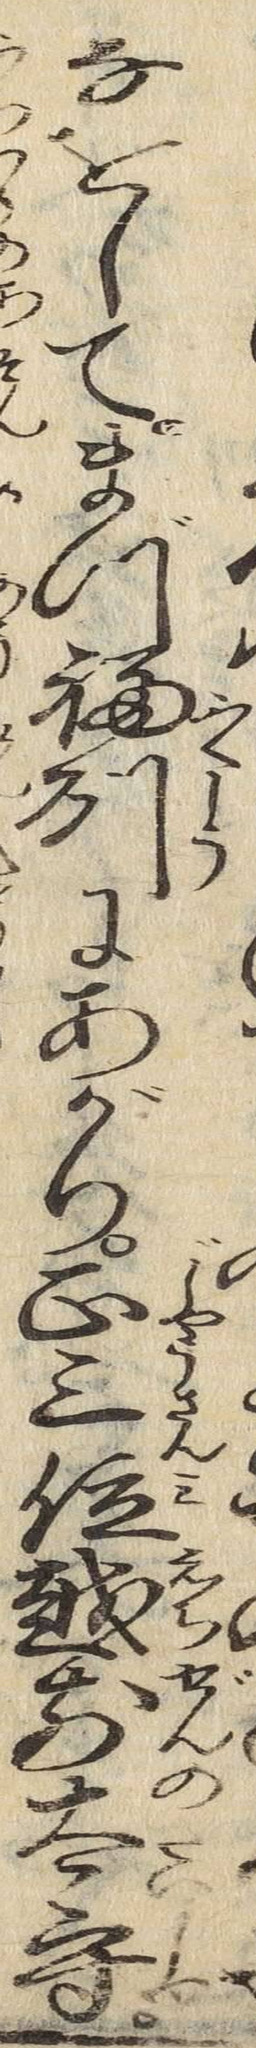なをしてまづ福州にあがり。正三位越前太守。
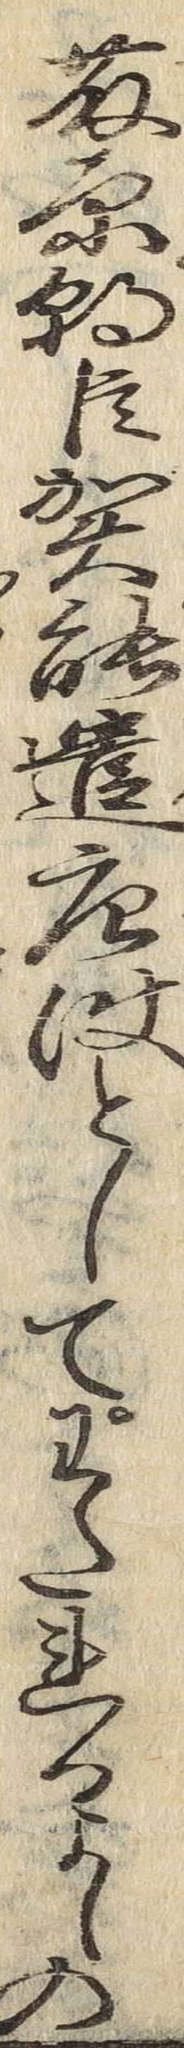藤原朝臣賀能遣唐使として。わたれるよしの
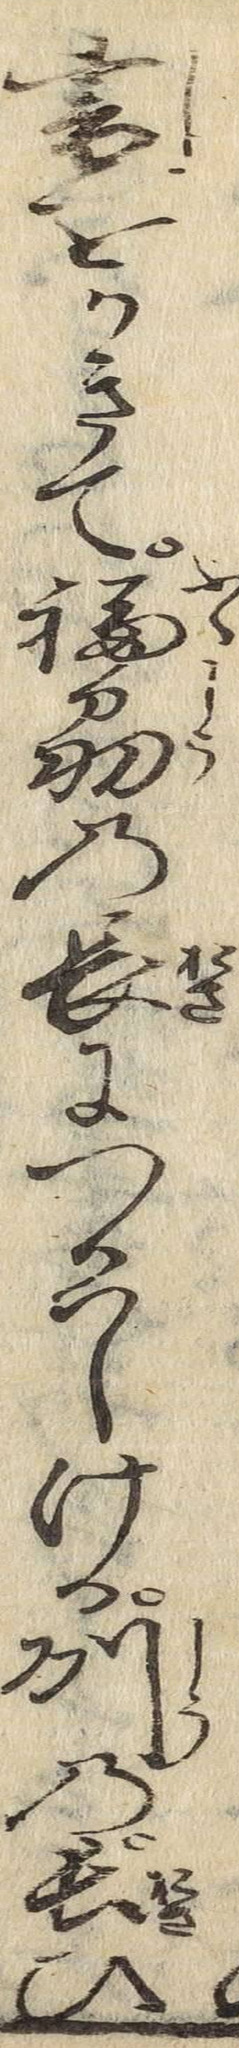書をかきて。福州の長につかはしける。州の。長ひ
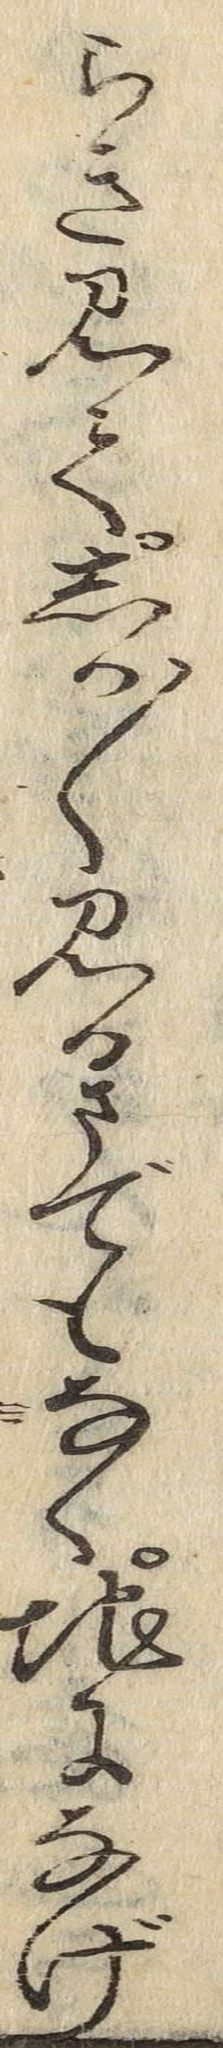らき見て。しか〳〵見るまでもなく。地になげ
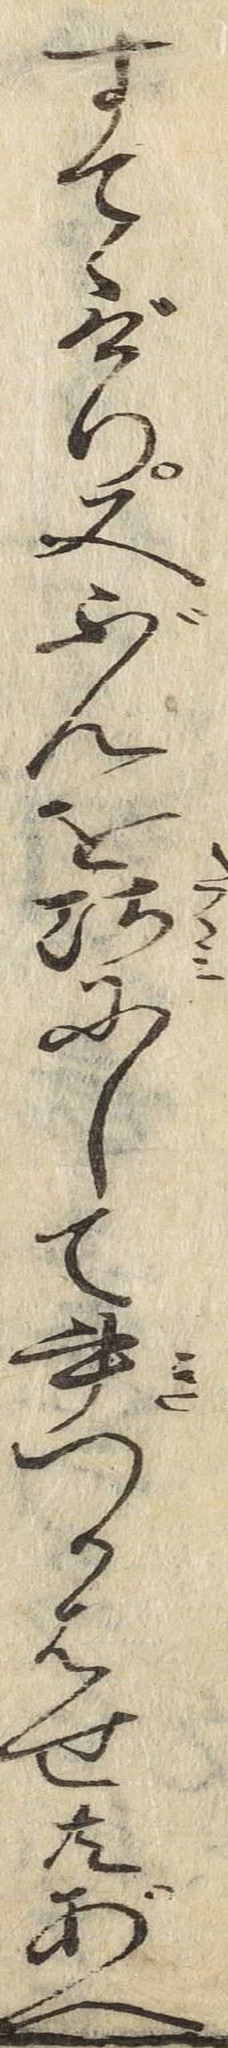すてゝげり。又ぶんを巧にして書つかはせ共。あへ
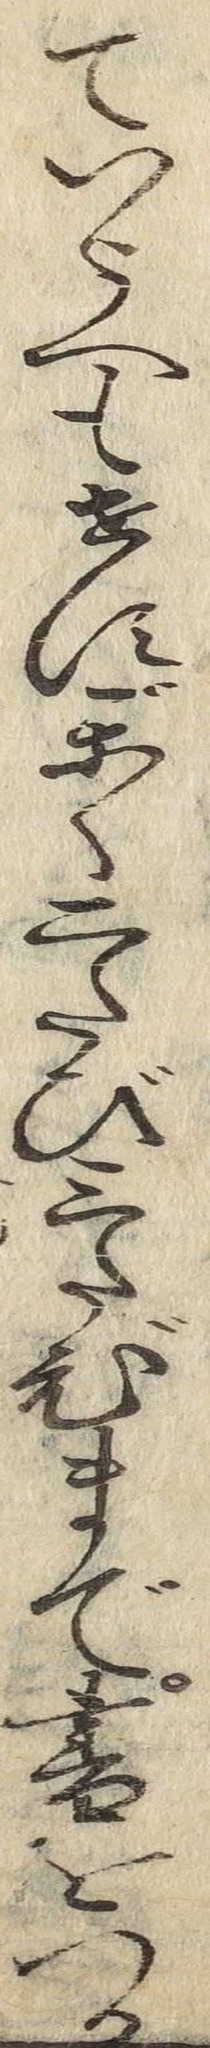ていらへもせす。かく二たび三たびまで。書をつか
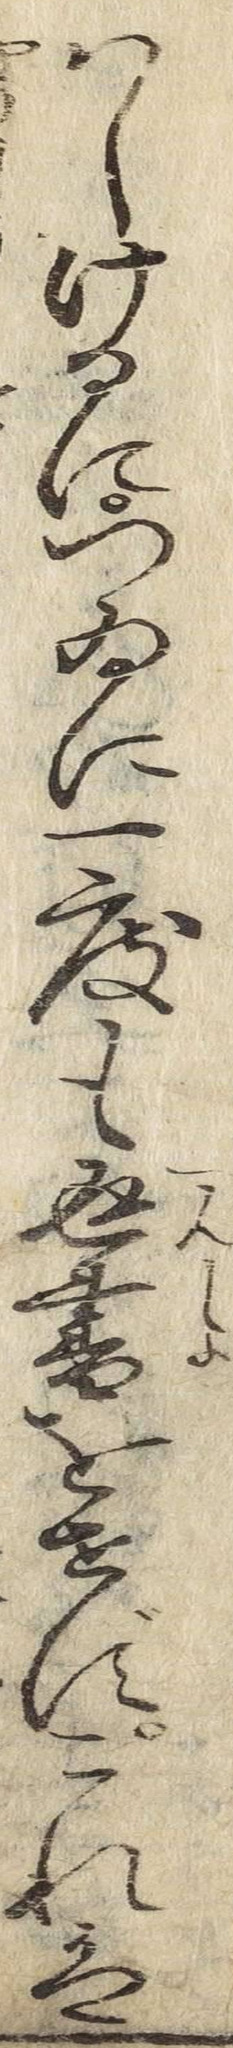はしけるに。つゐに一度も返書をせず。これは
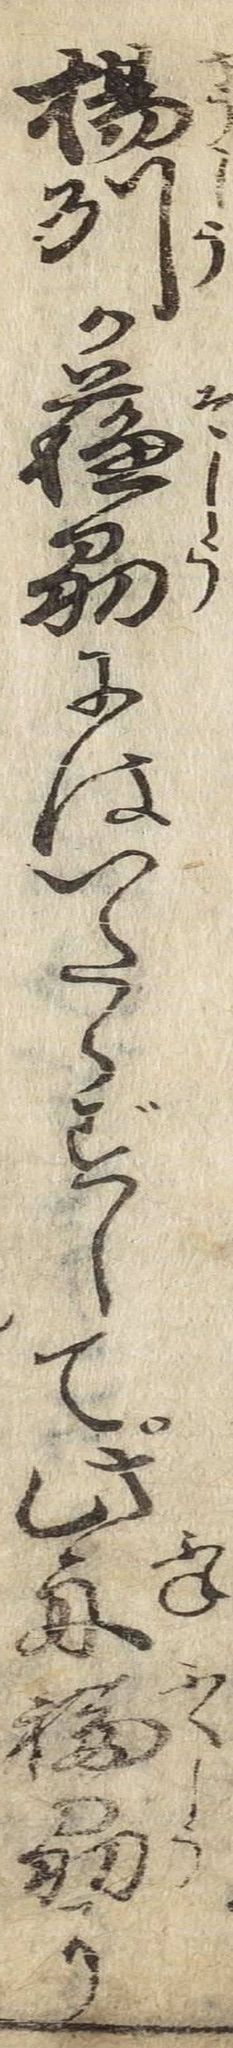揚州か蘇州にはいたらずして。此舟福州に
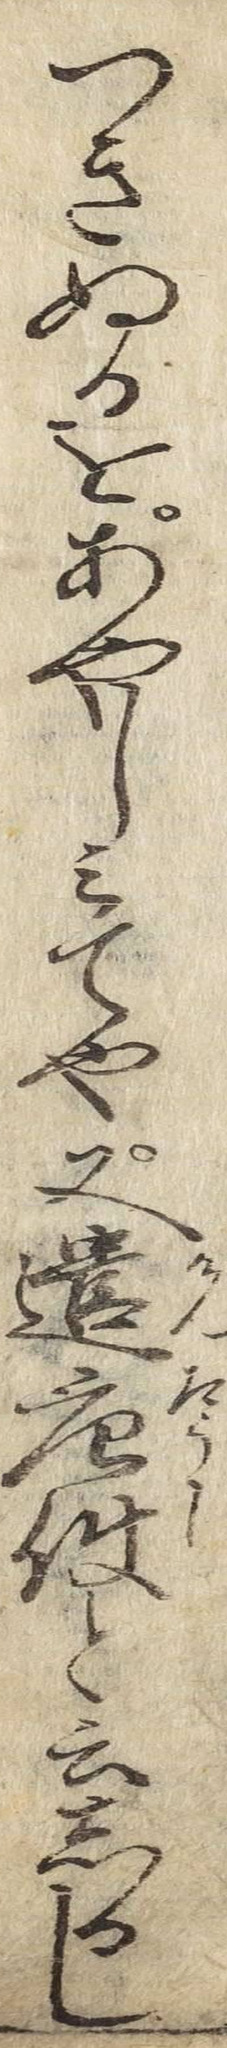つきぬるを。あやしみてや。又遣唐使と云しるし
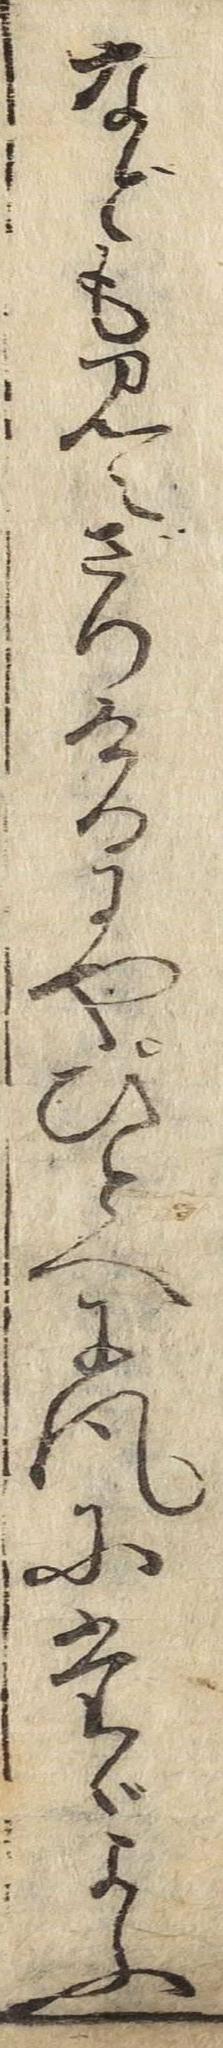なとも見えざりけるにや。ひとへに風にたゞよふ

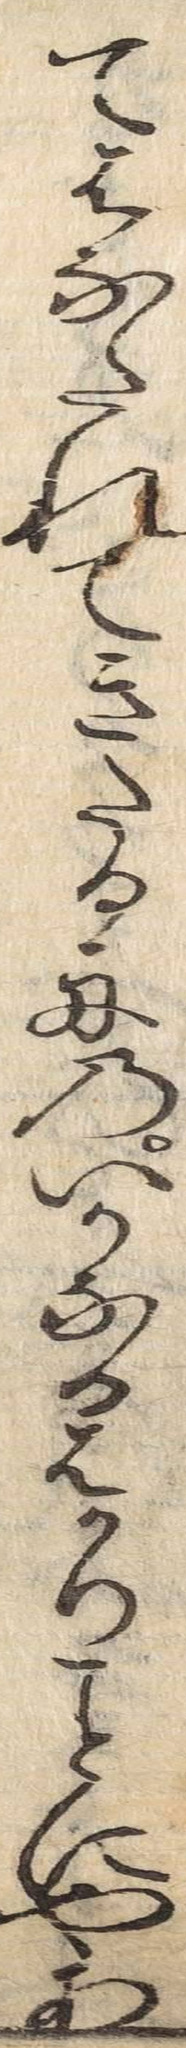てはなたれてきたる舟の。いかなるはかりことにやあ
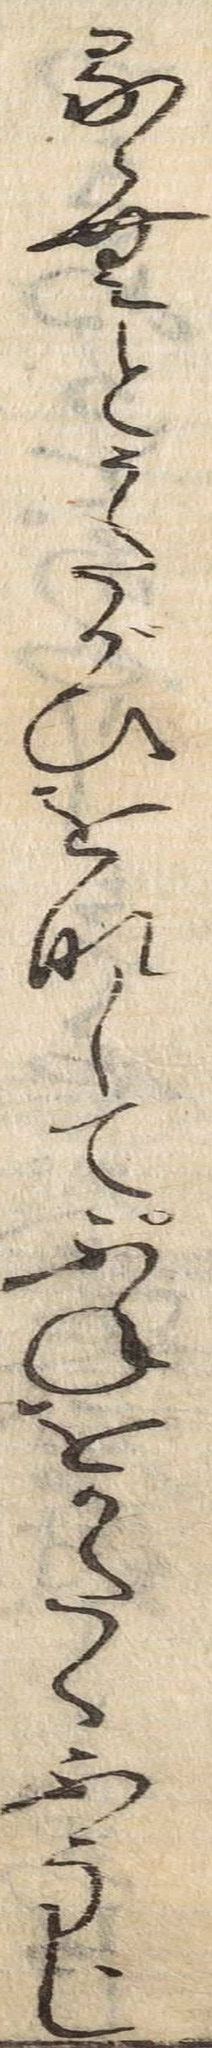るらむとうたがひをなして。ふねをかたくふうじ
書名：弘法大師御傳記
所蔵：京都府立京都学・歴彩館 国文学研究資料館
